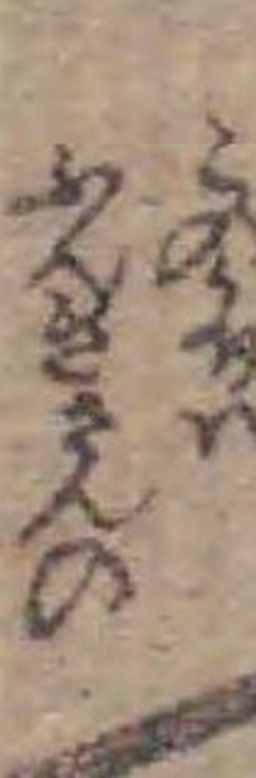ふんきさんの
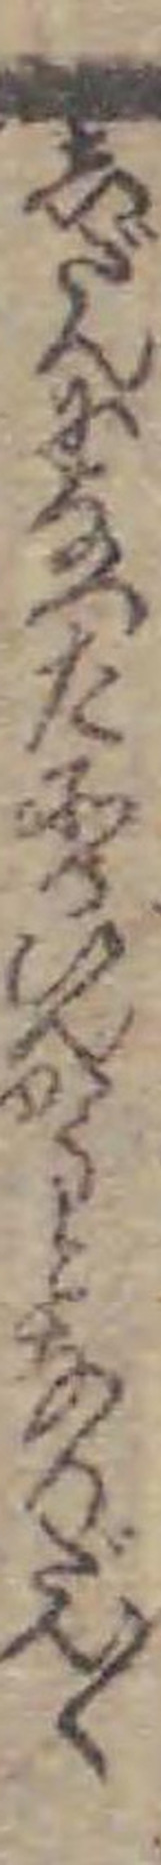しだんになつた所のひんかくとなりだん〳〵
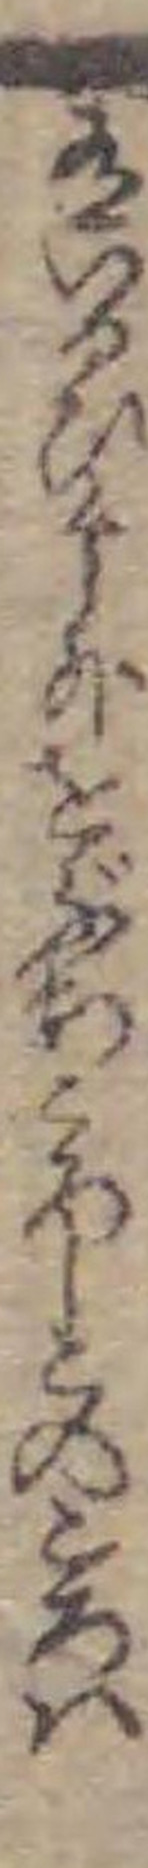有いるひ其外をぶちこわしこのころは
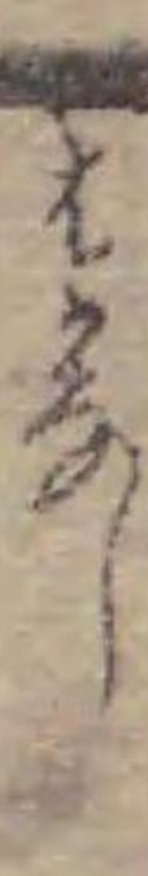はかなし
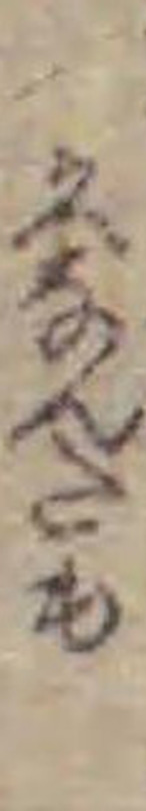かへなんたも
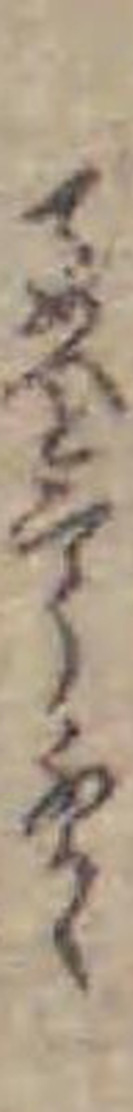てめへとこうふかく
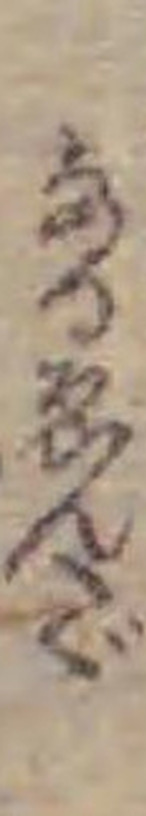なるゑんだ
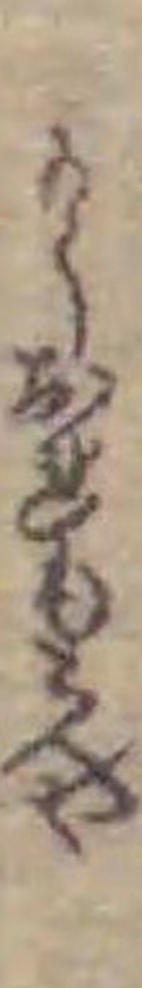もうおれもこんや
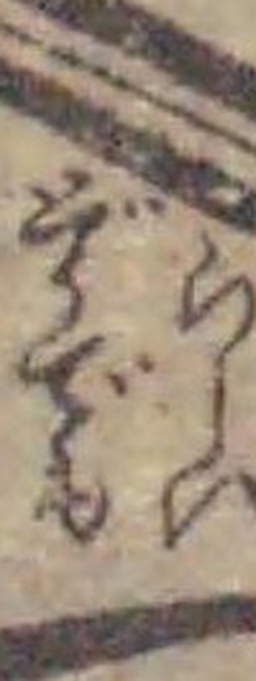どうでも
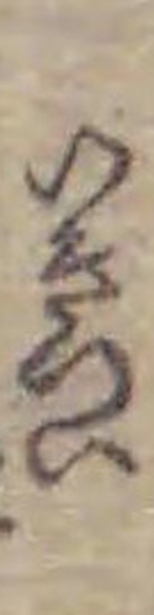いきつい
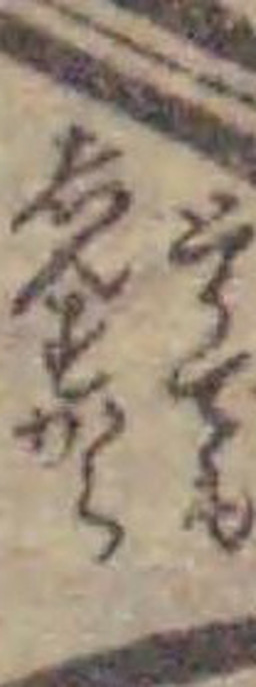しんすから
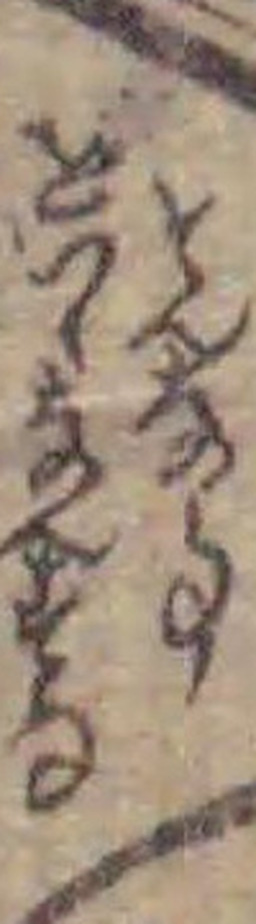いゝなんすな

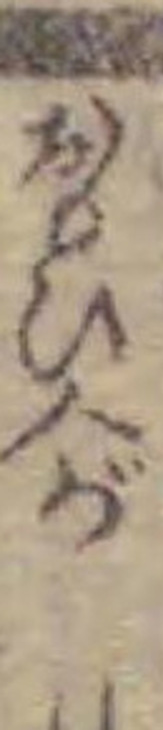おもひ人が
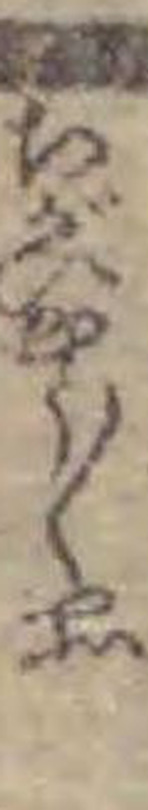ちがひゆく〳〵品
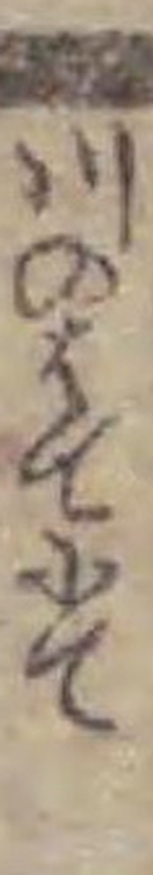川の果てにて
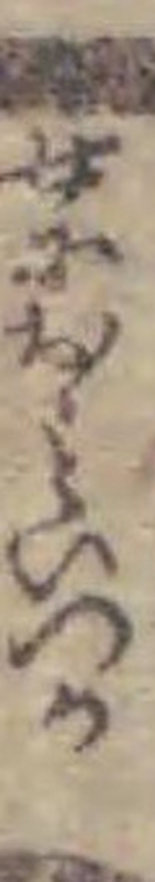女におもいつか
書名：通風伊勢物語 : 3巻
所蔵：国立国会図書館 National Diet Library, JAPAN
